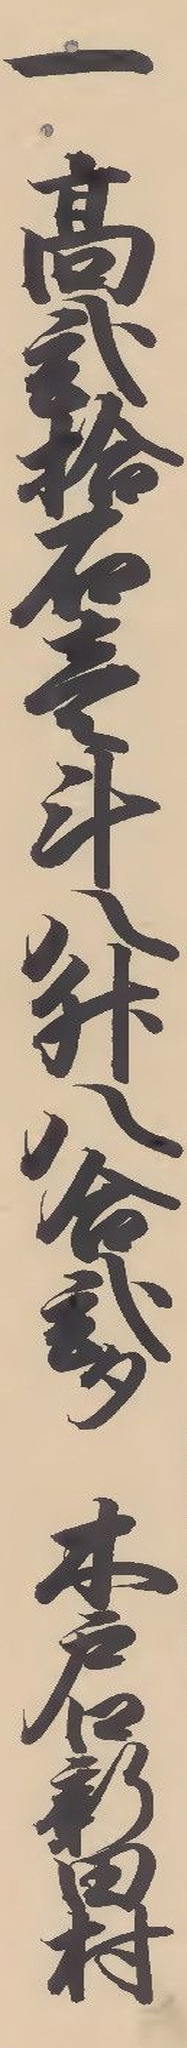一高弐拾石壱斗八升八合弐勺木戸口新田村
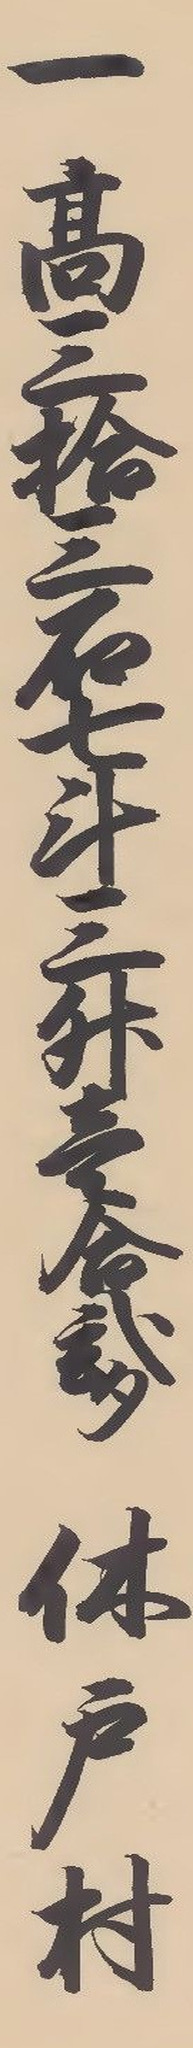一高三拾三石七斗三升壱合弐勺休戸村
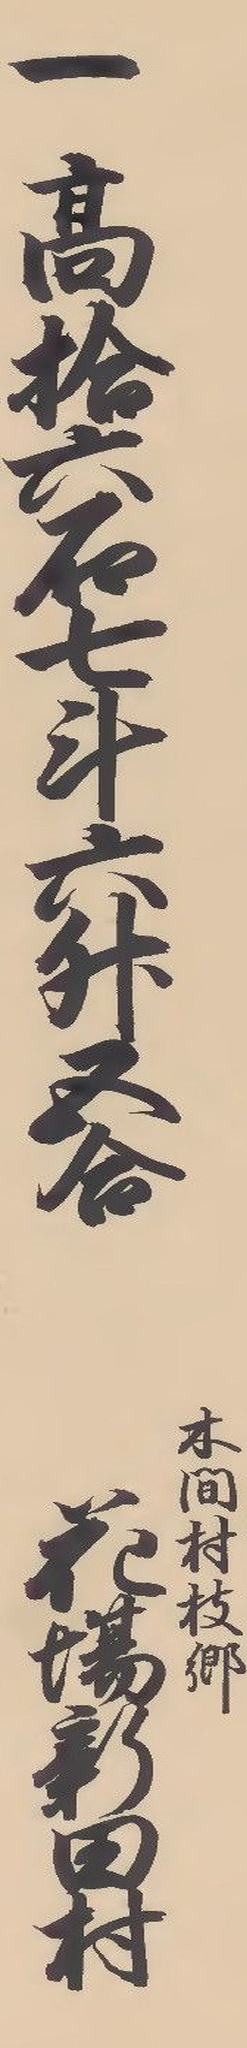一高拾六石七斗六升五合花場新田村
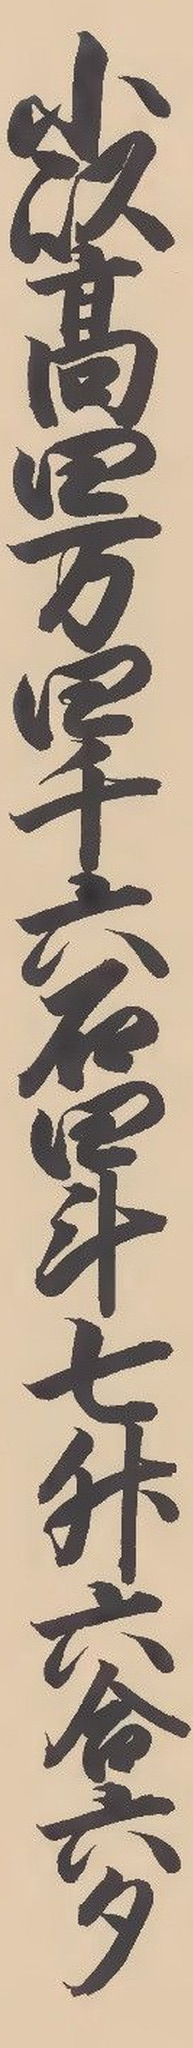小以高四万四千六石四斗七升六合六勺

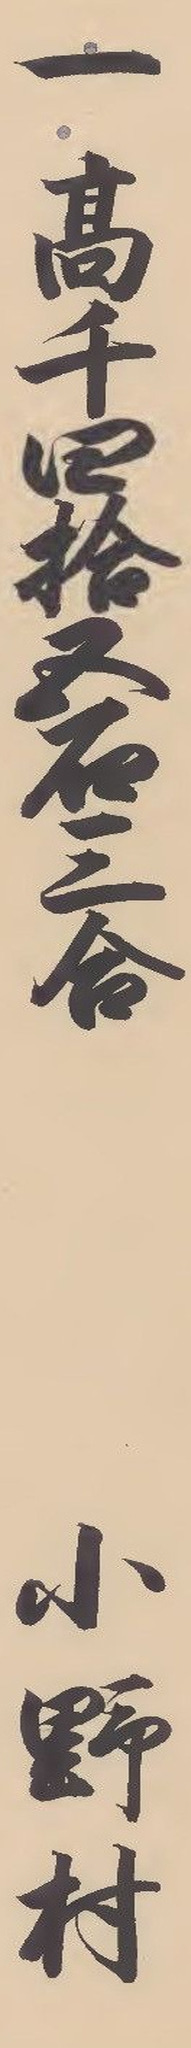一高千四拾五石三合小野村
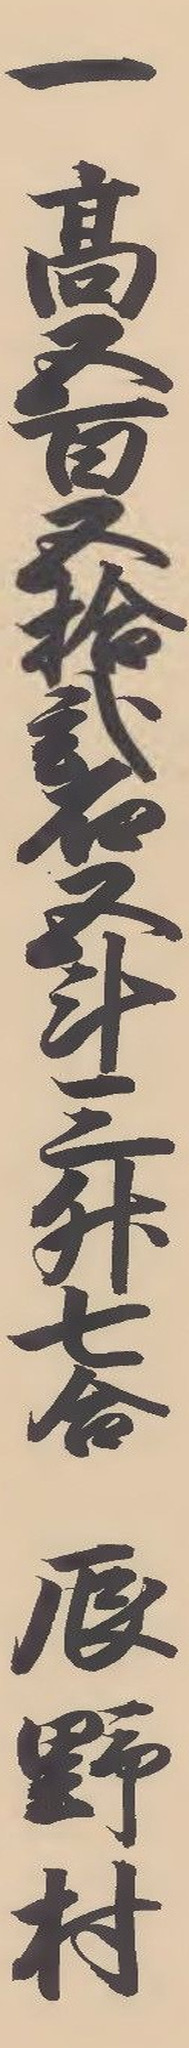一高五百五拾弐石五斗三升七合辰野村
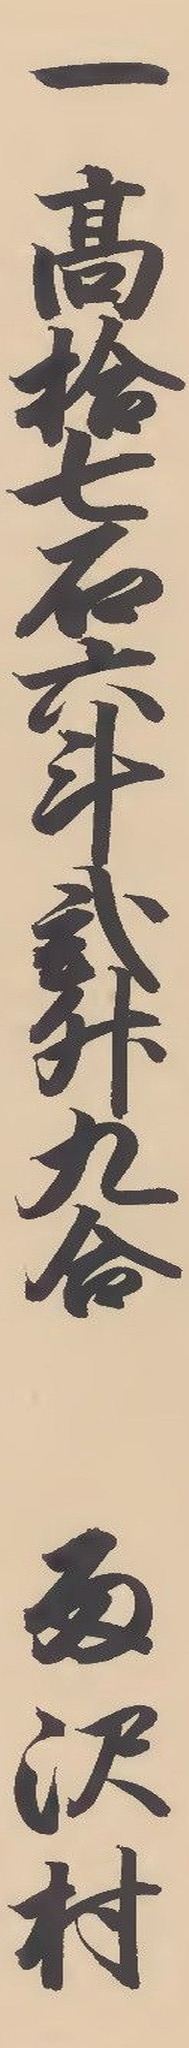一高拾七石六斗弐升九合雨沢村
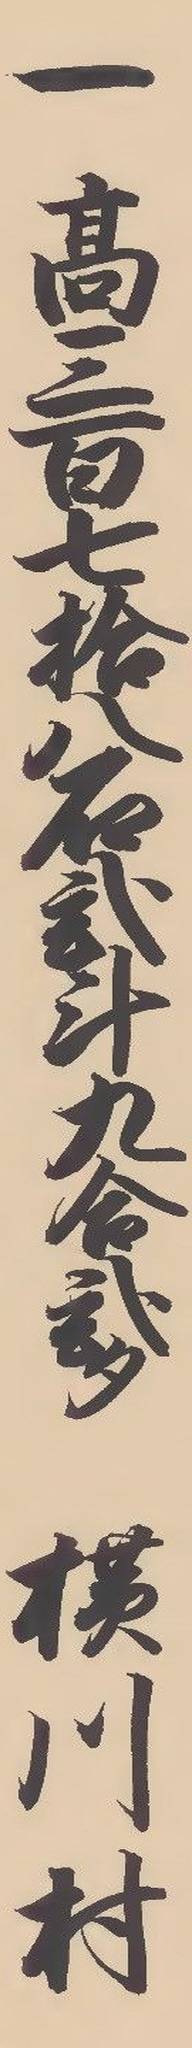一高三百七拾八石弐斗九合弐勺横川村
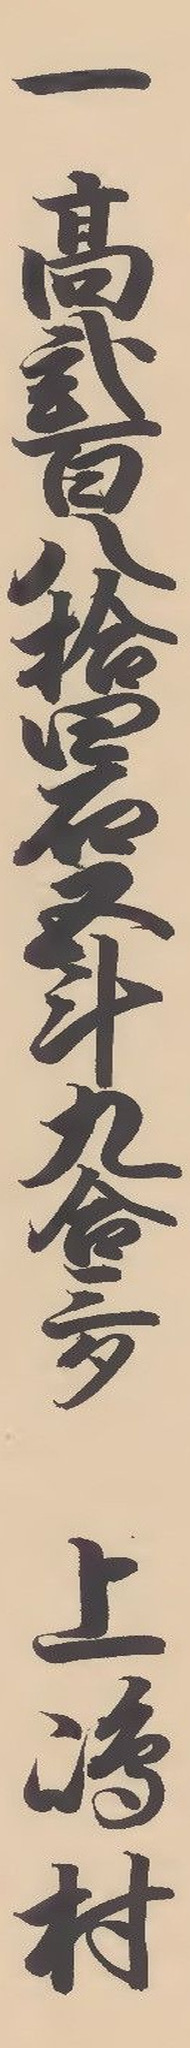一高弐百八拾四石五斗九合三勺上島村
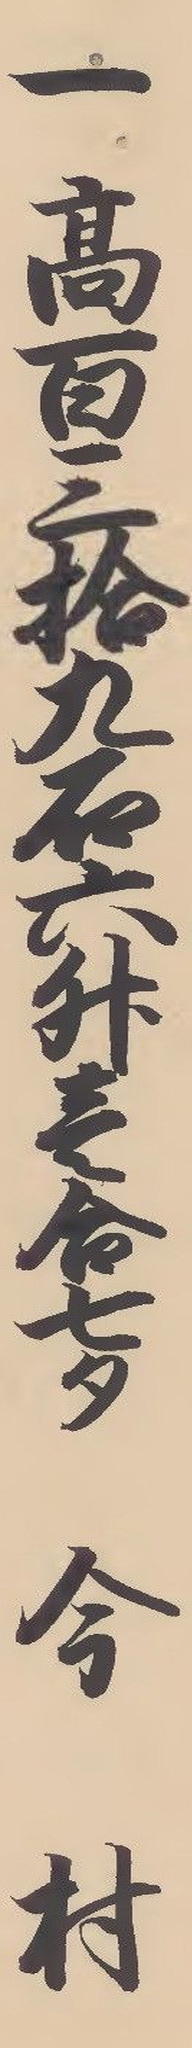一高百三拾九石六升壱合七勺今村
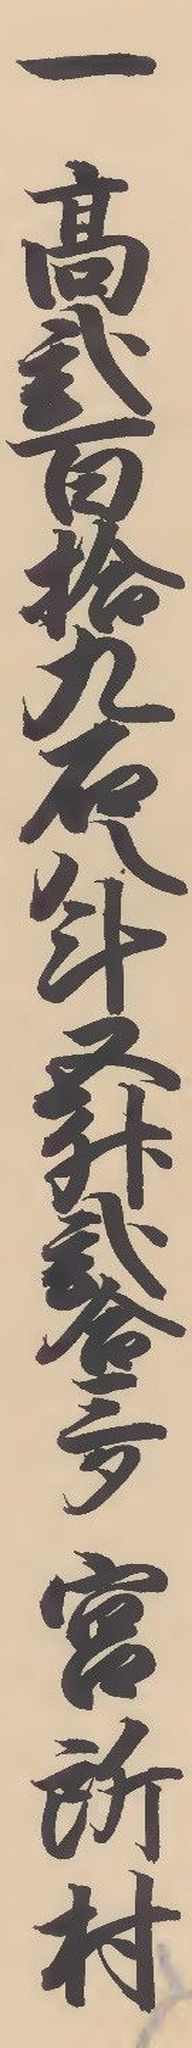一高弐百拾九石八斗五升弐合三勺宮所村

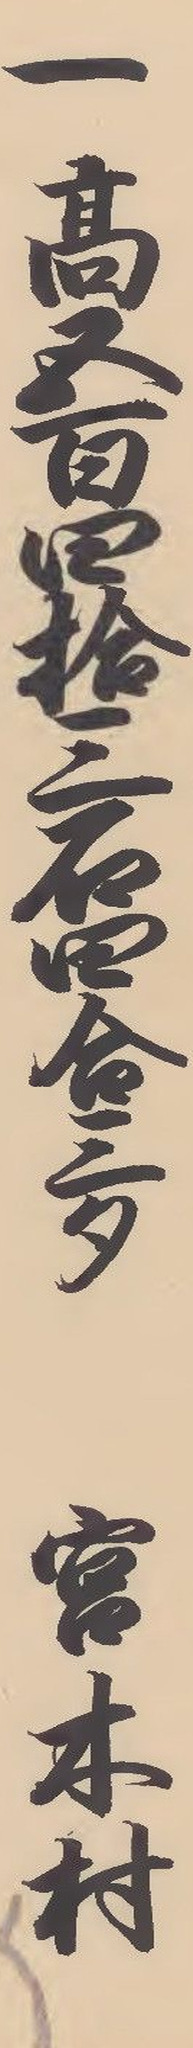一高五百四拾三石四合三勺宮木村
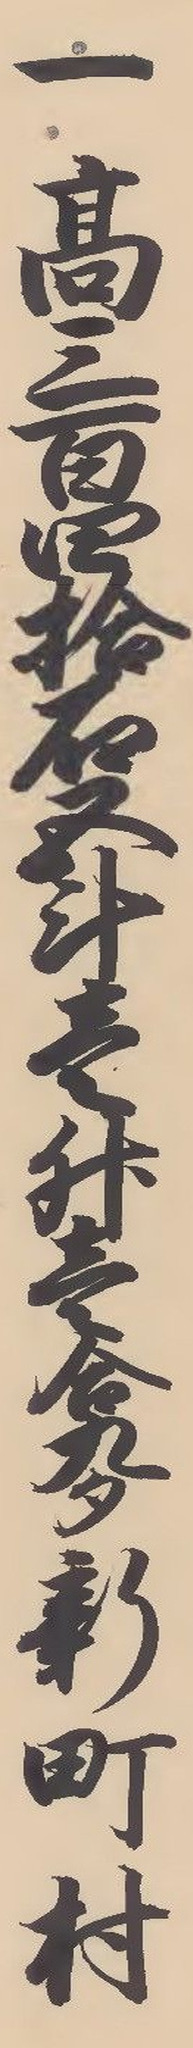一高三百四拾石五斗壱升壱合九勺新町村
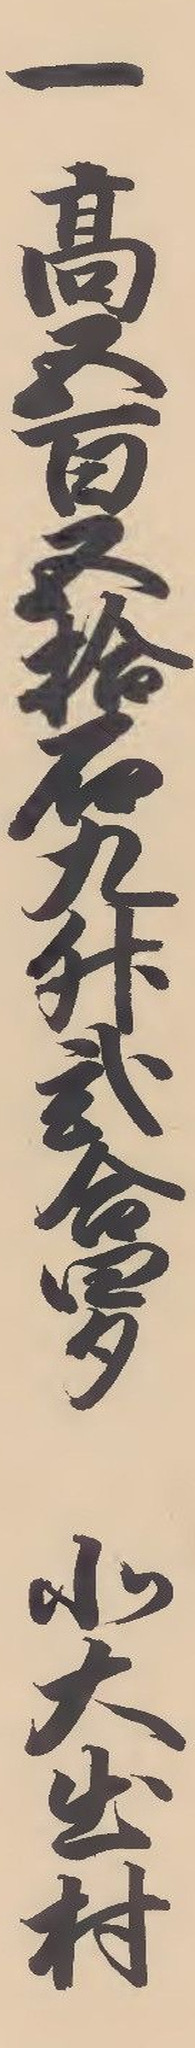一高五百五拾石九升弐合四勺北大出村
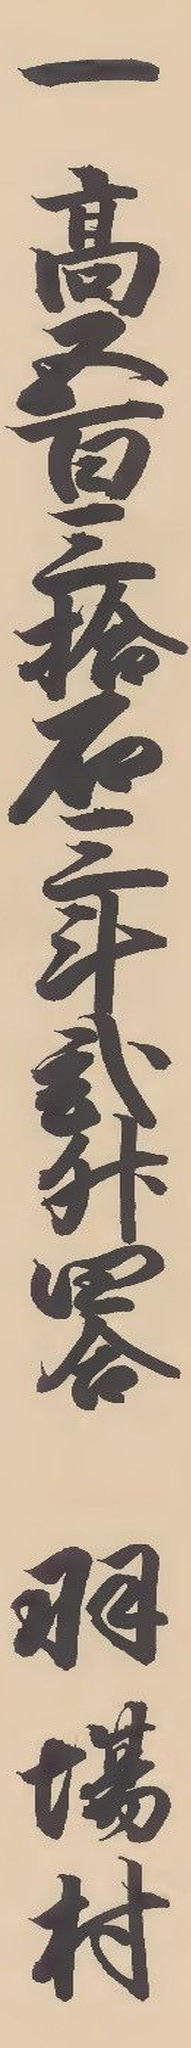一高五百三拾石三斗弐升四合羽場村
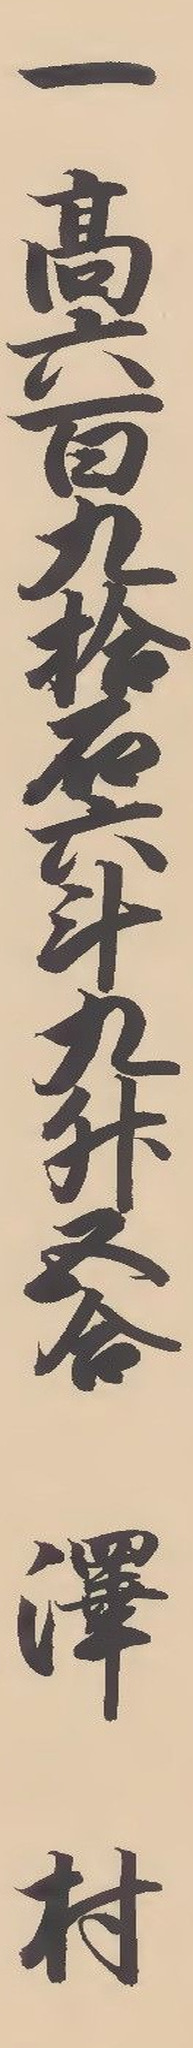一高六百九拾石六斗九升五合沢村
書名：信濃国郷帳
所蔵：国立公文書館 National Archives of Japan
